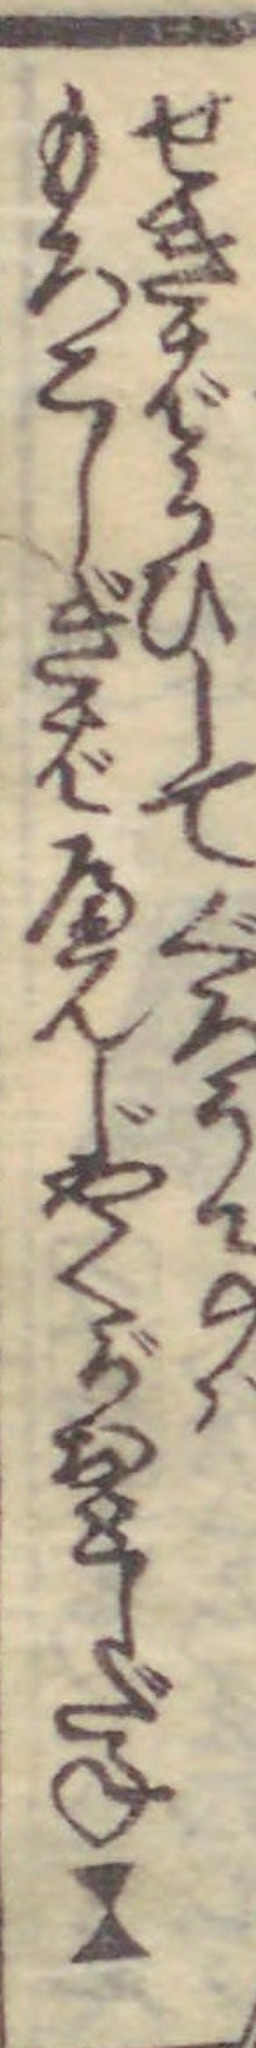もろこしぎばへんじやくがおとしだね▼▲
